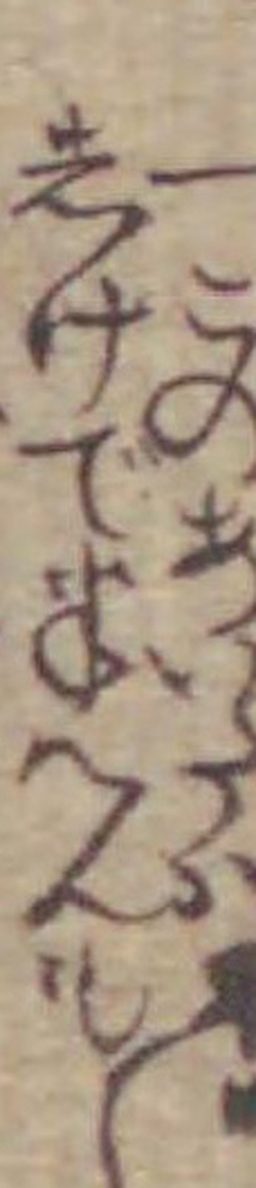しけで半へんも
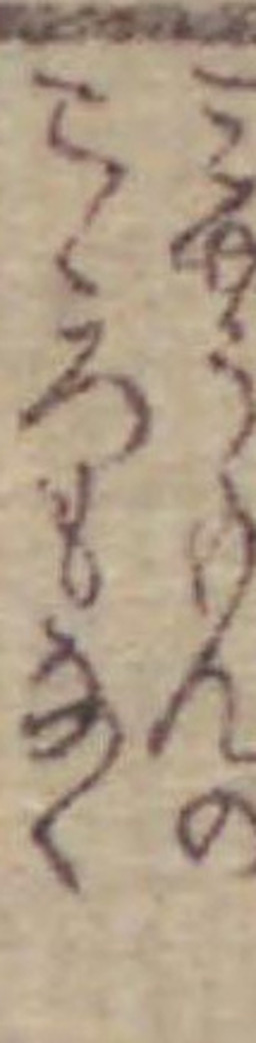こゝろもなく
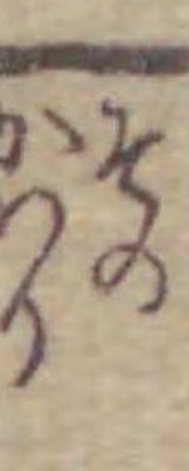かはり
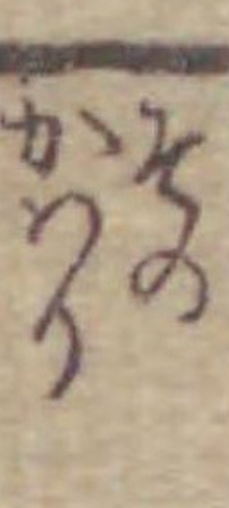かはり
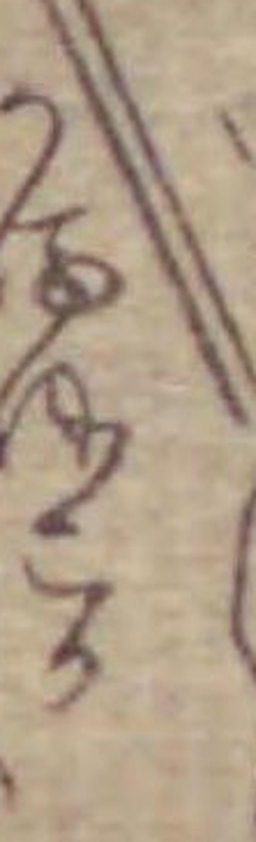かまほこか
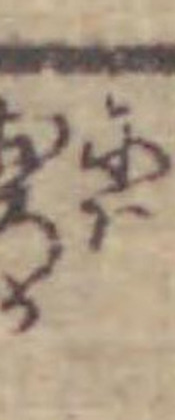おろか
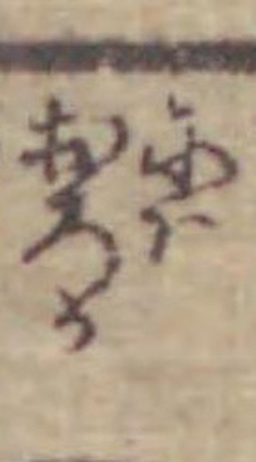おろか
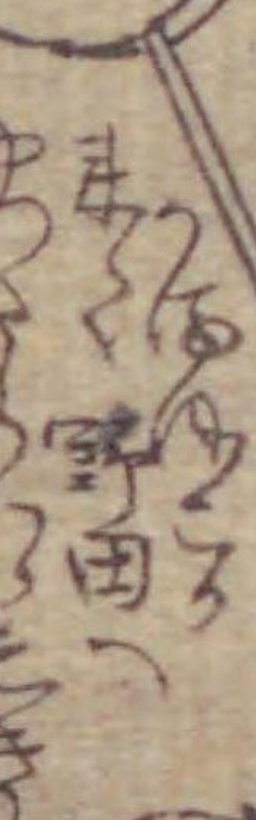来た野田へ
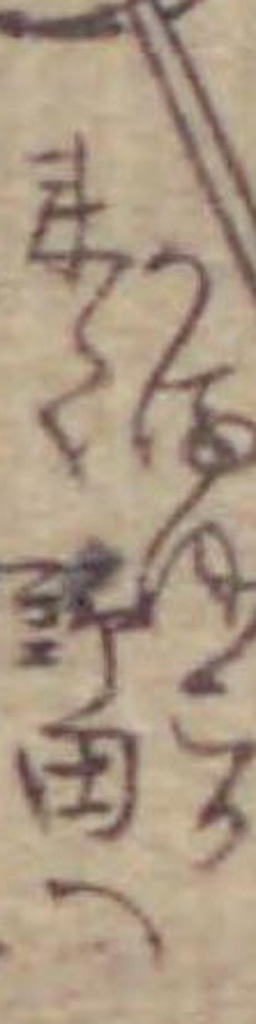来た野田へ
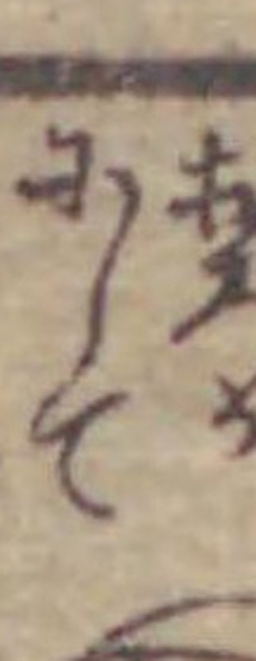にして
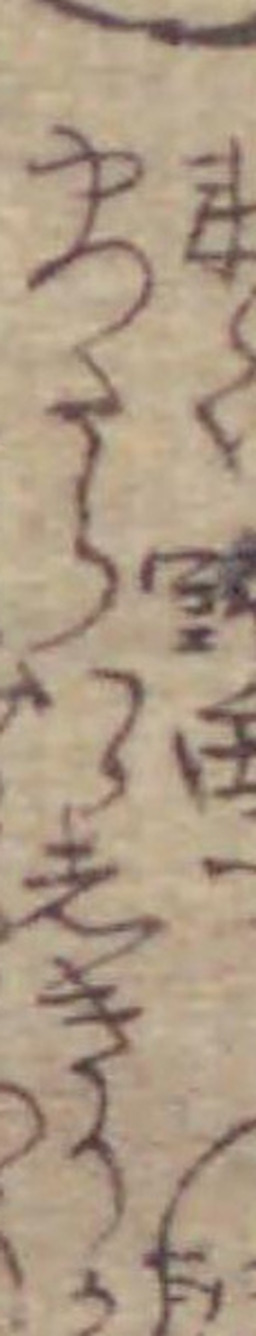やつたらいゝしきりか
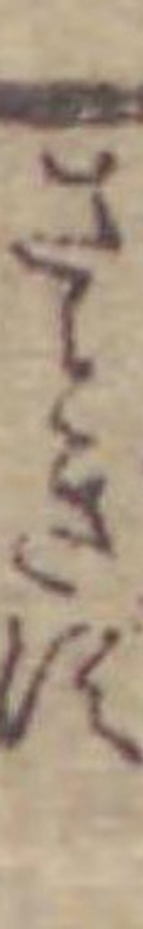さとさず
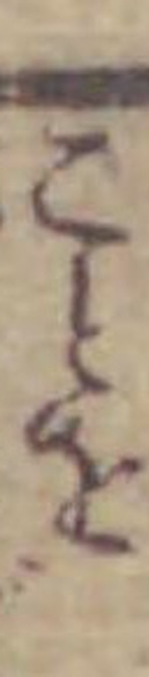ことを
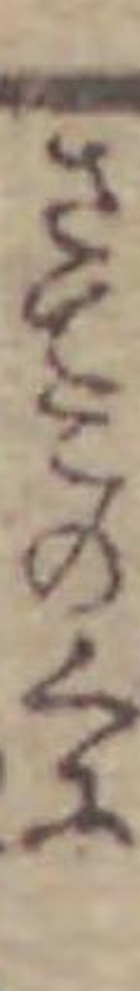さてこのくに
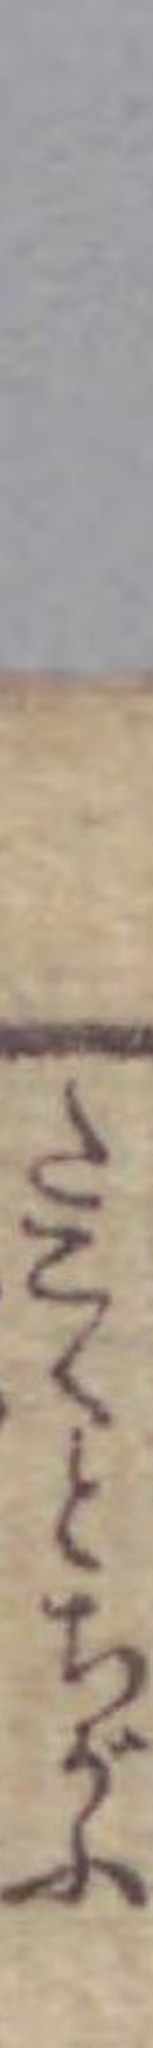たこくとちがふ
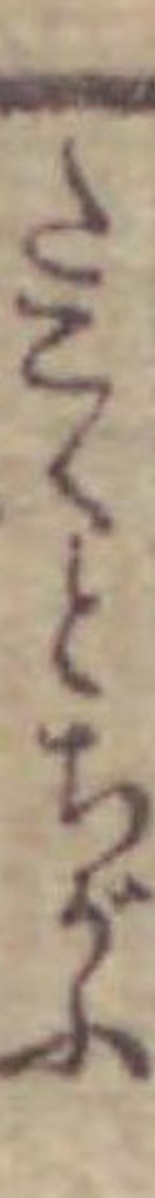たこくとちがふ
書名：和荘兵衛後日話 : 3巻
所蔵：国立国会図書館 National Diet Library, JAPAN
